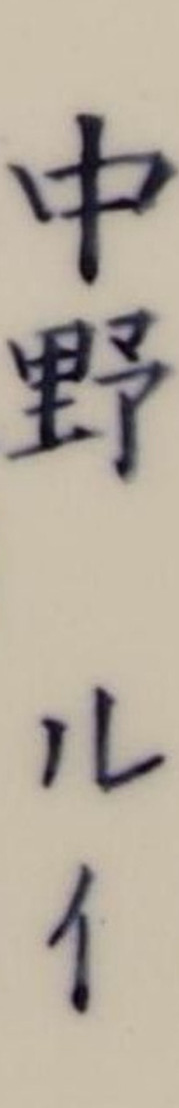中野ルイ
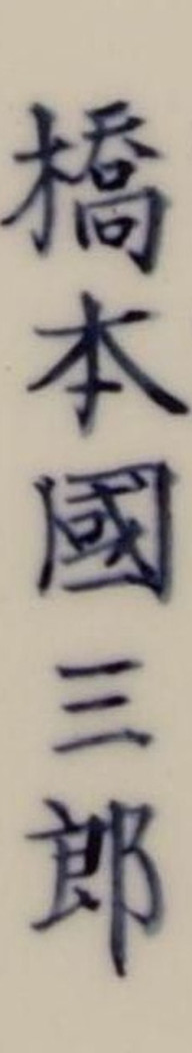橋本國三郎
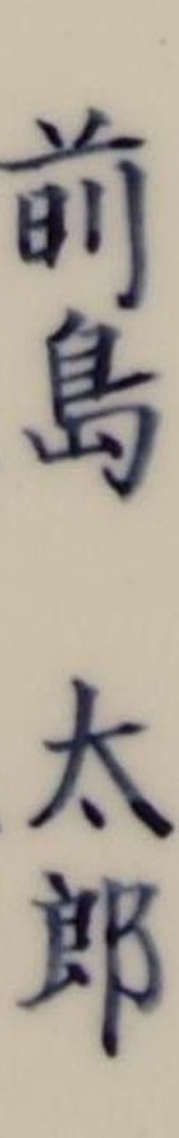前島太郎
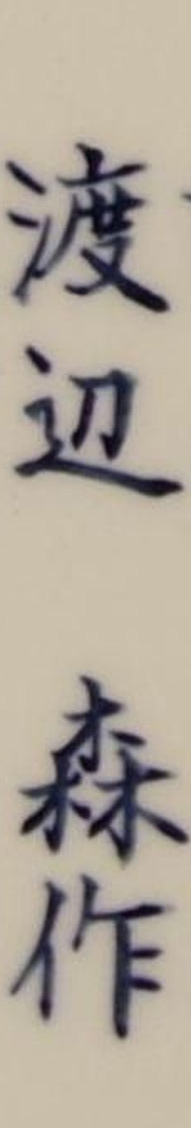渡辺森作
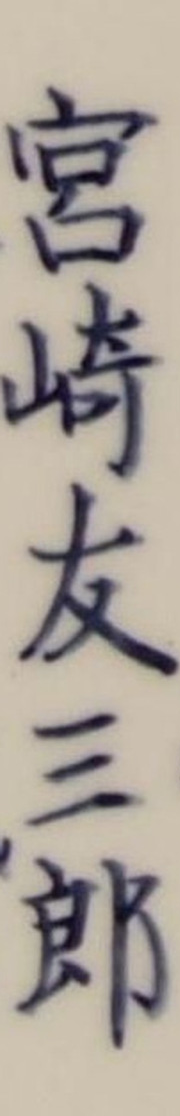宮崎友三郎
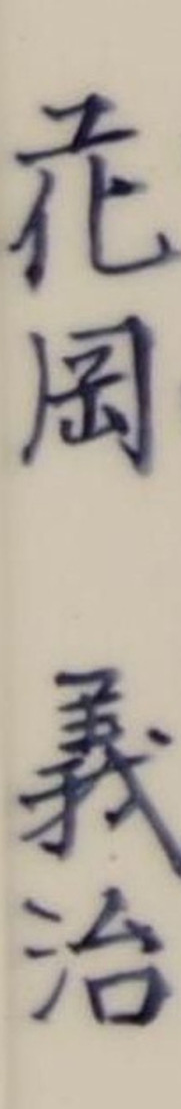花岡義治

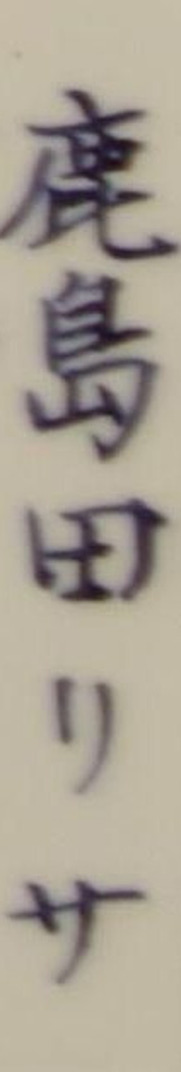鹿島田リサ
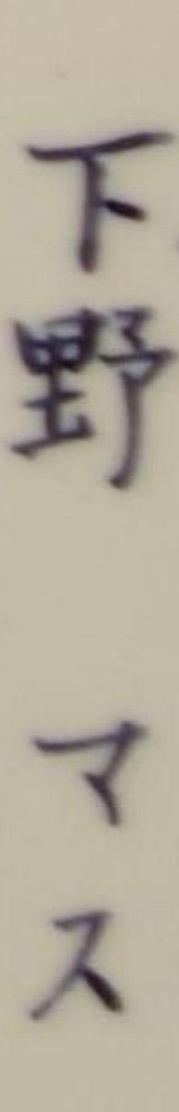下野マス
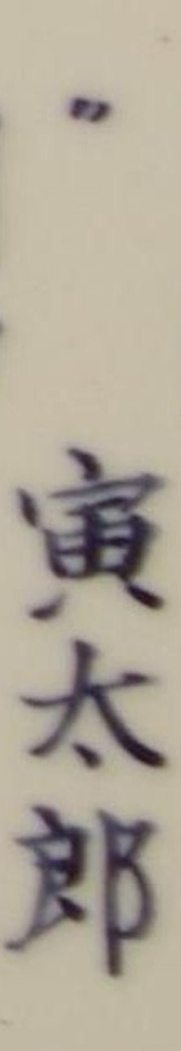寅太郎
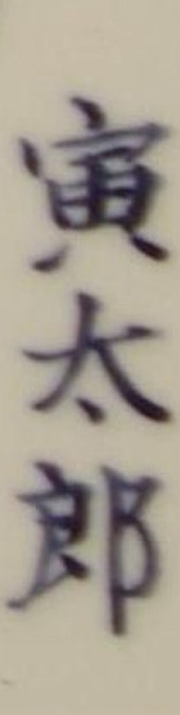寅太郎
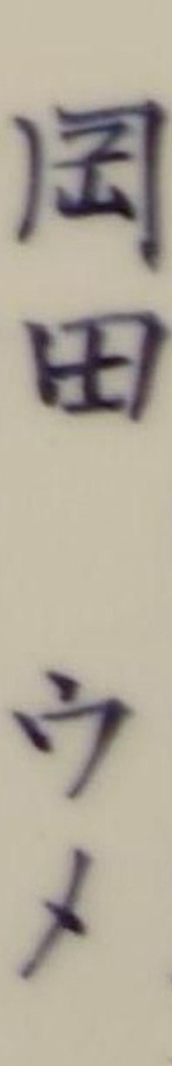岡田ウメ
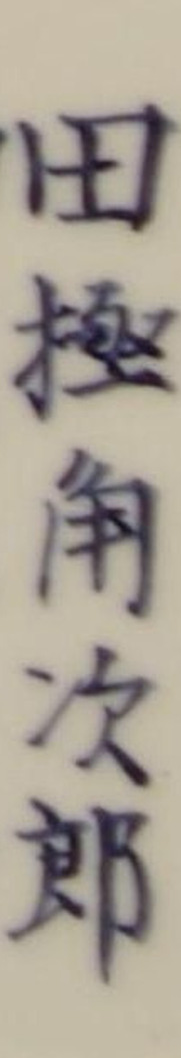田極角次郎
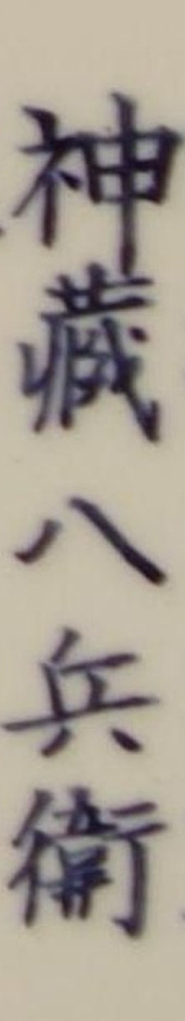神蔵八兵衛
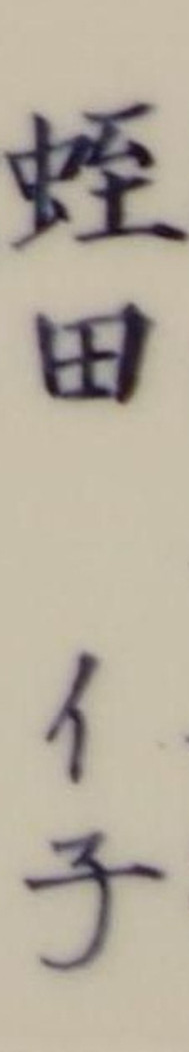蛭田イ子
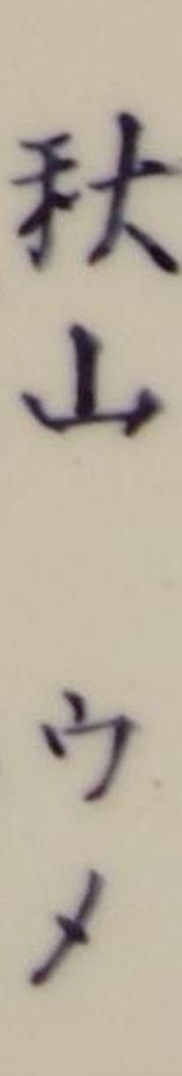秋山ウメ
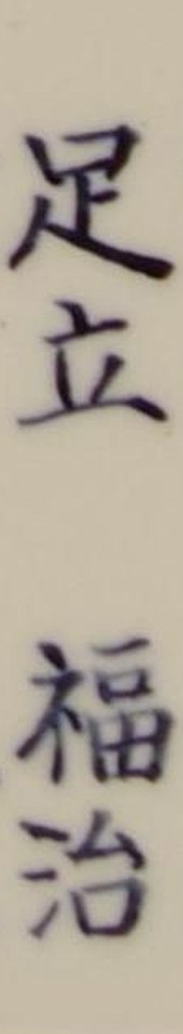足立福治
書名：M~S
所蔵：高野山金剛峯寺
